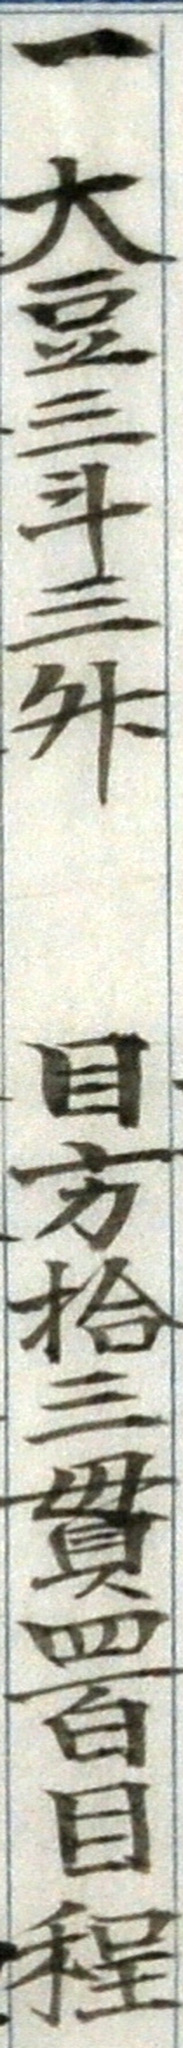一大豆三斗三升目方拾三貫四百目程
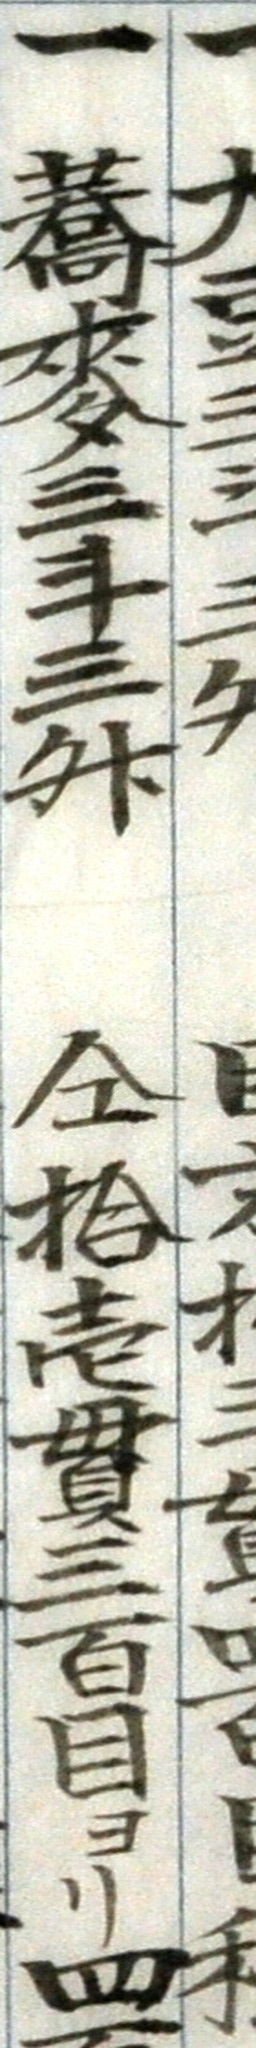一蕎麦三斗三升同拾壱貫三百目ヨリ四百目迄
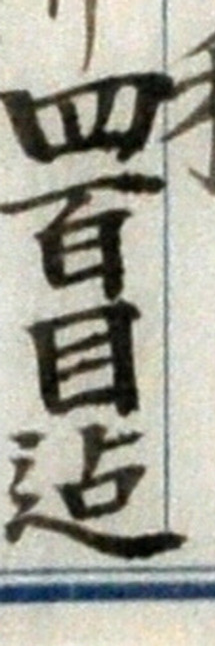七百目迄
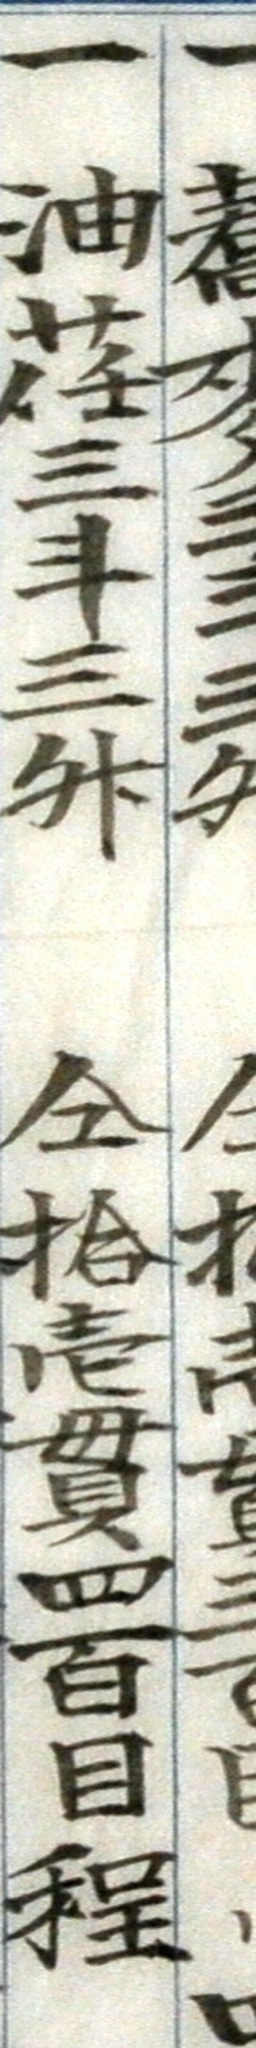一油荏三斗三升同拾壱貫四百目程
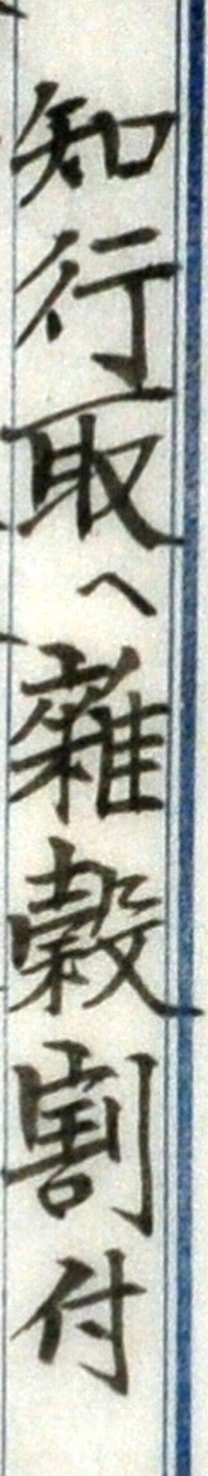知行取へ雑穀割付
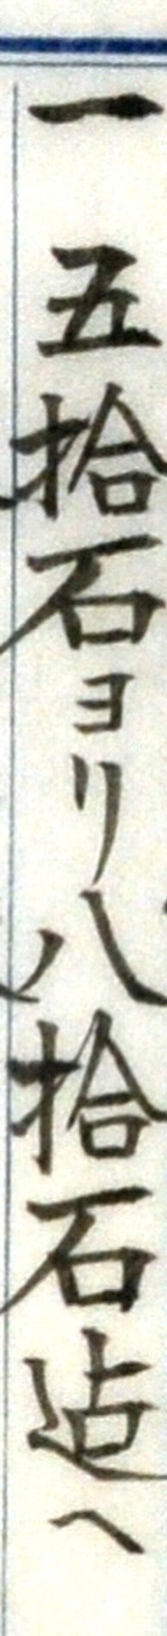一五拾石ヨリ八拾石迄へ
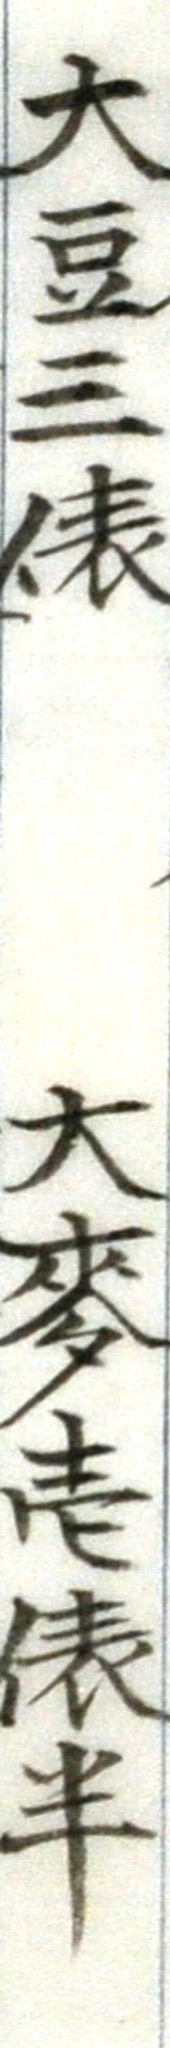大豆三俵大麦壱俵半
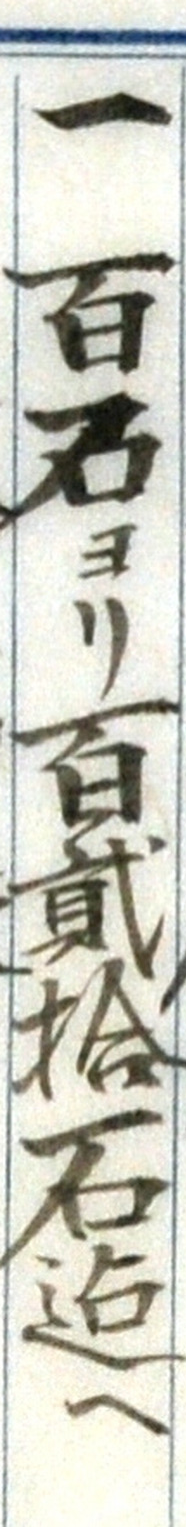一百石ヨリ百弐拾石迄へ
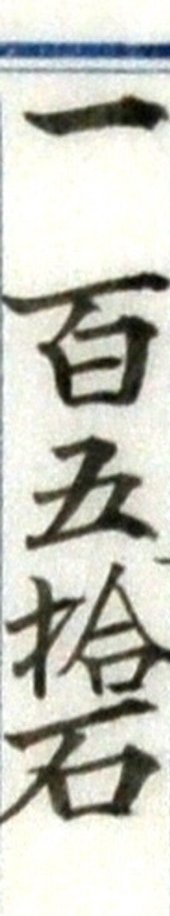一百五拾石
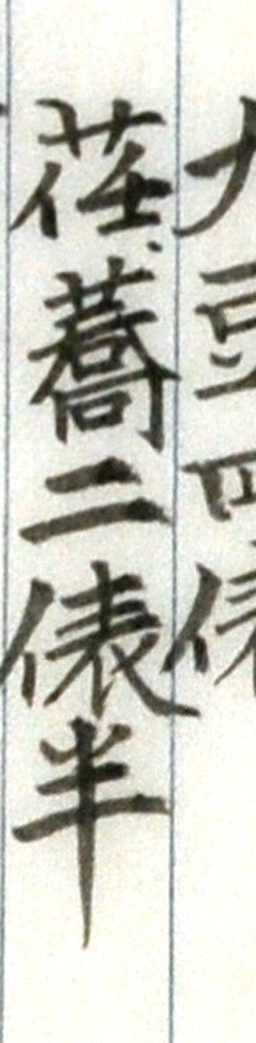荏蕎二俵半
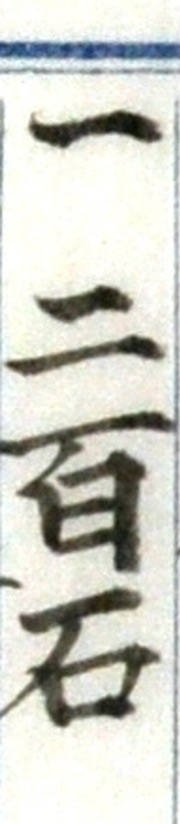一二百石

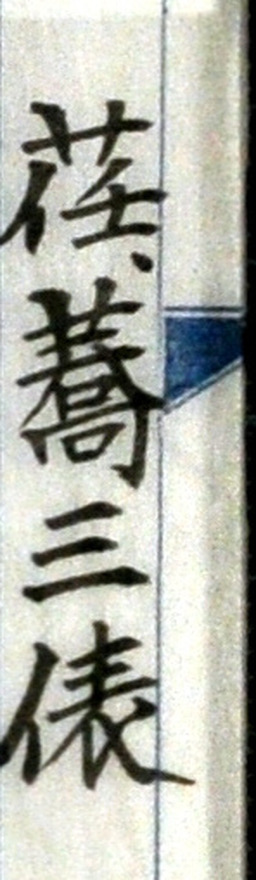荏蕎三俵
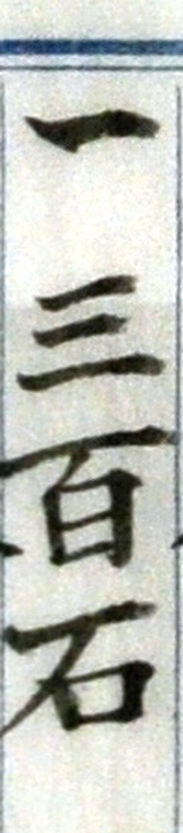一三百石
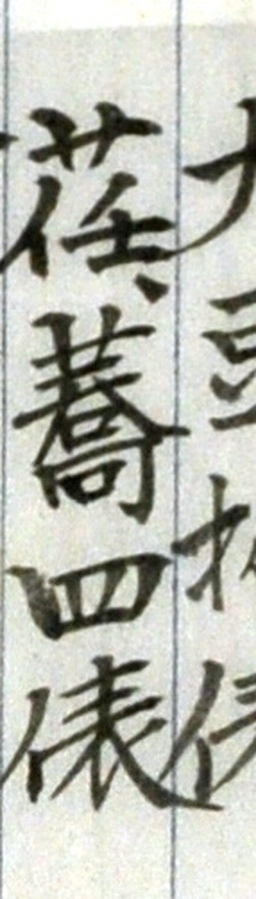荏蕎四俵
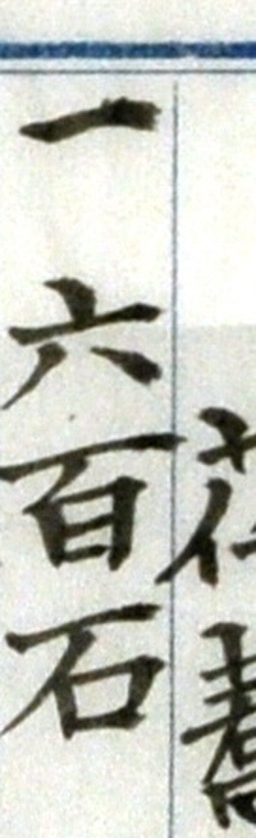一六百石
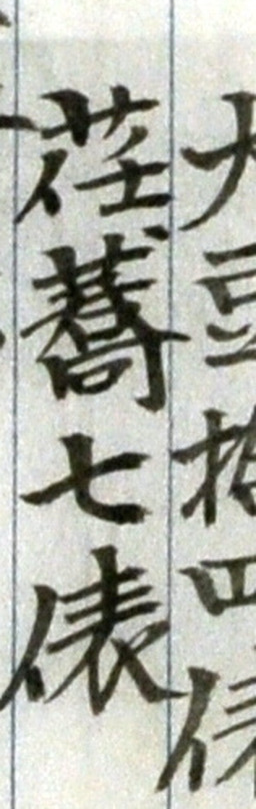荏蕎七俵
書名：御定法
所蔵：伊那市立高遠町図書館・合同会社AMANE
